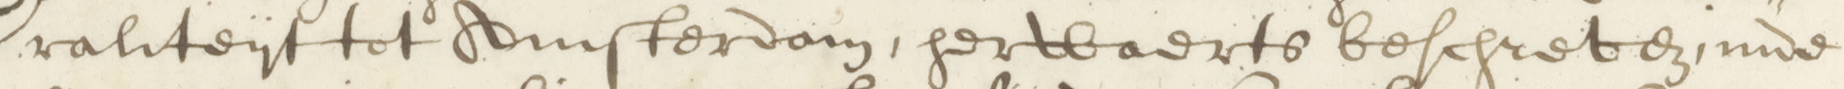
raliteijt tot Amsterdam, herwaerts beschreven, inde
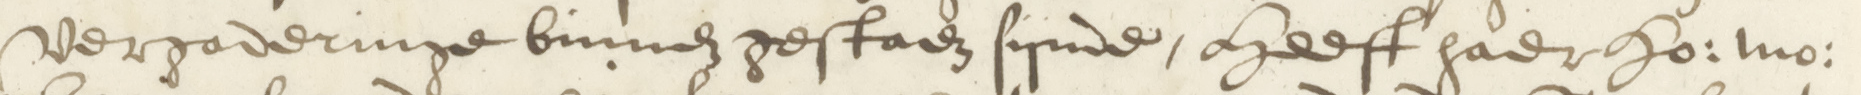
Vergaderinge binnen gestaen sijnde, heeft haer Ho:Mo:
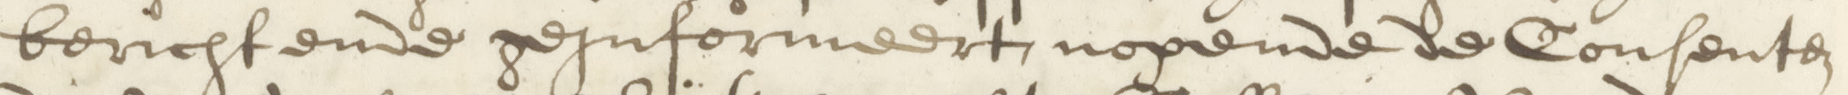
bericht ende geinformeert, nopende de Consenten
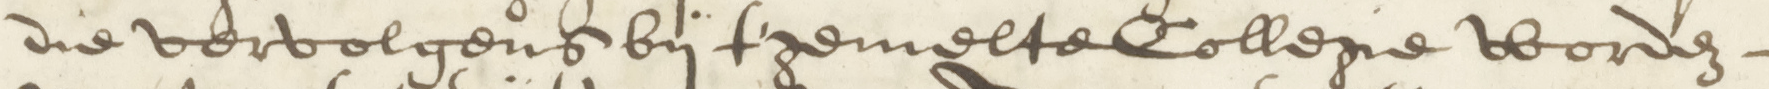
die vervolgens bij t'gemelte Collegie worden -
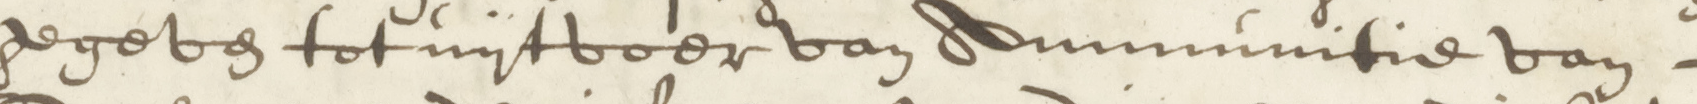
gegeven tot uijtvoer van Ammunitie van
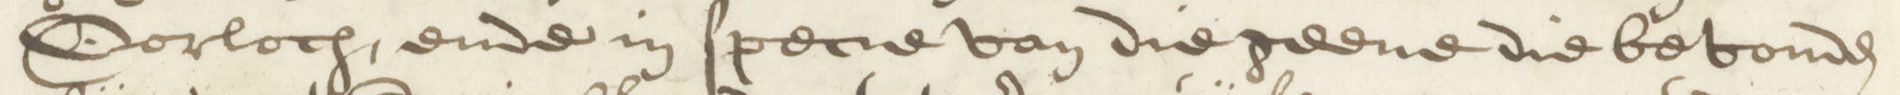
Oorloch, ende in specie van die geene die bevonden
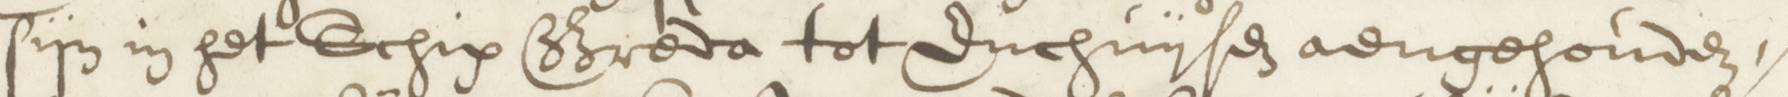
sijn in het Schip Breda tot Enchuijsen aengehouden.
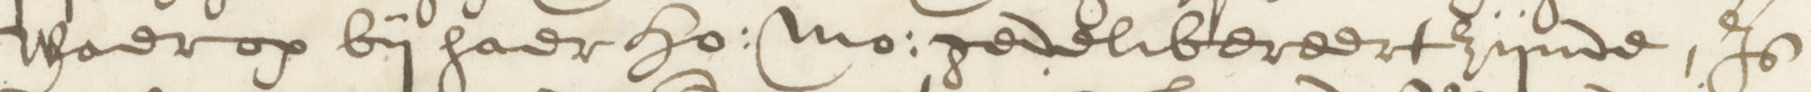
Waerop bij haer Ho:Mo: gedelibereert zijnde, Is
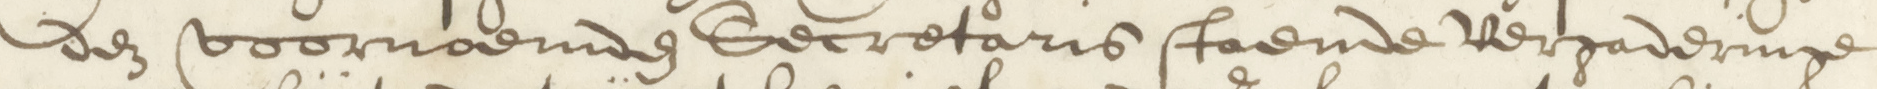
den voornoemden Secretaris staende Vergaderinge
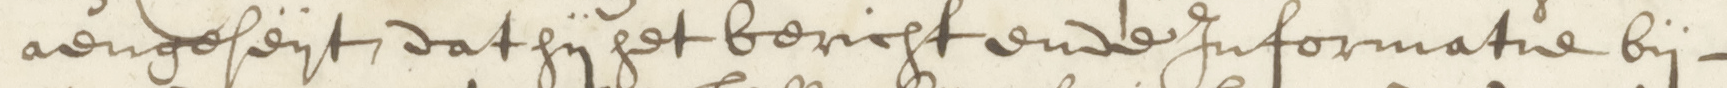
aengeseijt, dat hij het bericht ende Informatie bij -
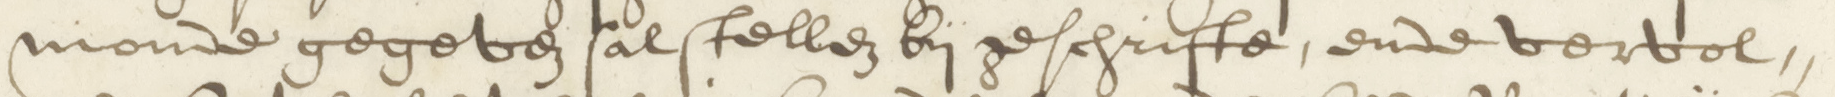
monde gegeven sal stellen bij geschrifte, ende vervol„
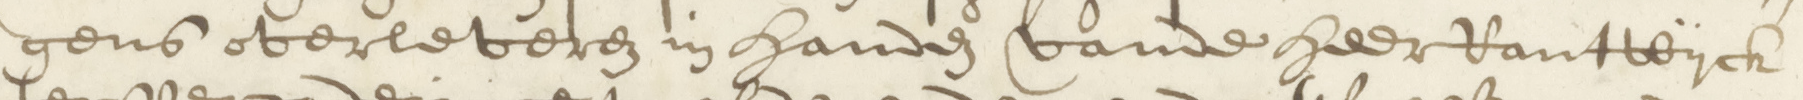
gens overleveren in handen vande heer Rantwijck
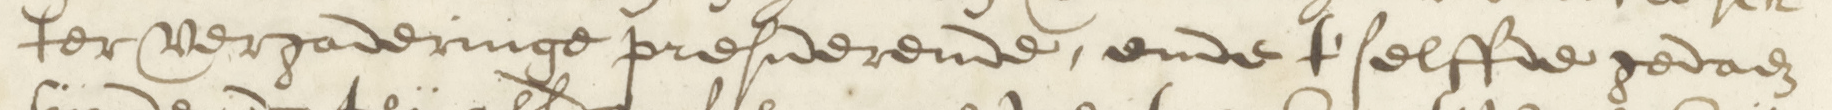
ter Vergaderinge presiderende, ende t'selffde gedaen
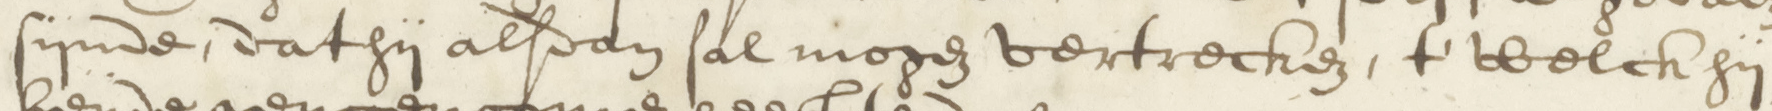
sijnde, dat hij alsdan sal mogen vertrecken, t'welck hij
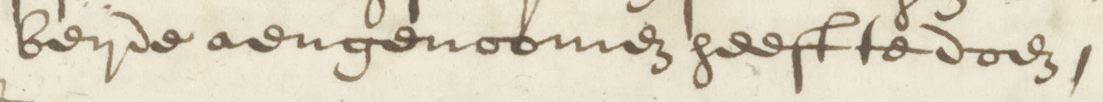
beijde aengenoomen heeft te doen.
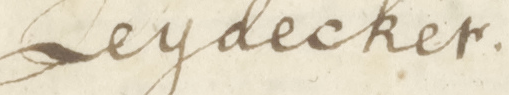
Leijdecker.
